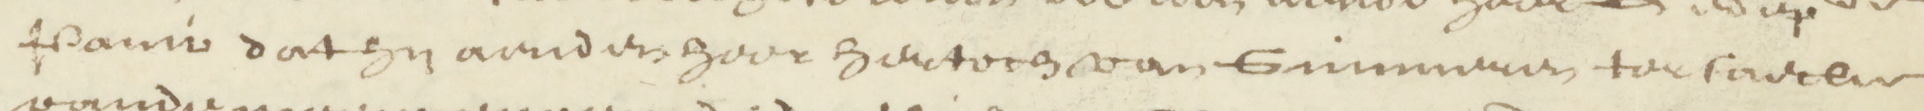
Pauw dat hy aenden heer hertoch van Simmeren ter saecke
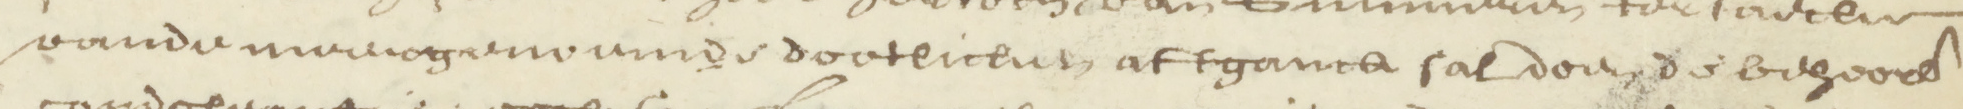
vande meergenoemde dootlicken affganck sal doen de behoorl
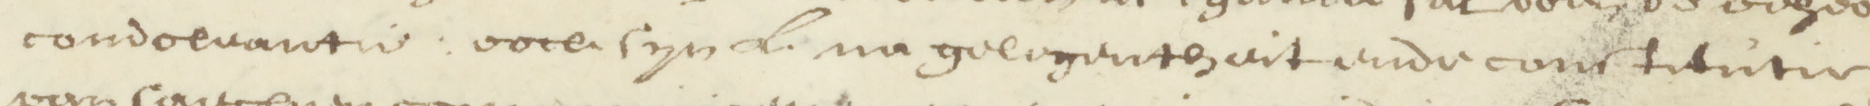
condoleantie: oock syn E. na gelegentheijt ende constitutie
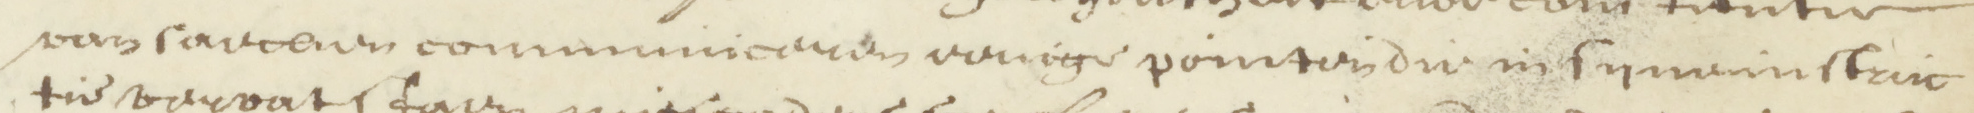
van saecken communiceren eenige pointen die in syne instruc„
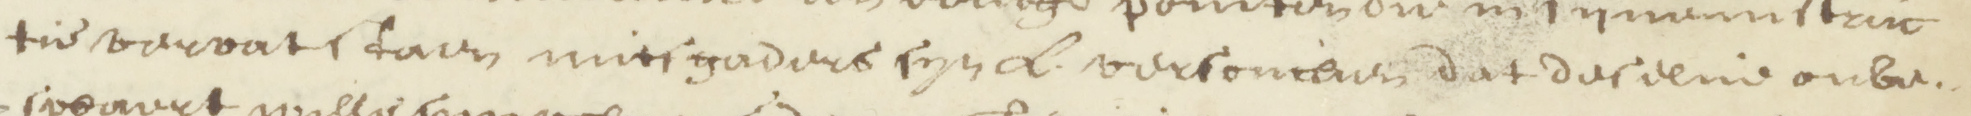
tie vervat staen mitsgaders syn E. versoucken dat deselue onbe„
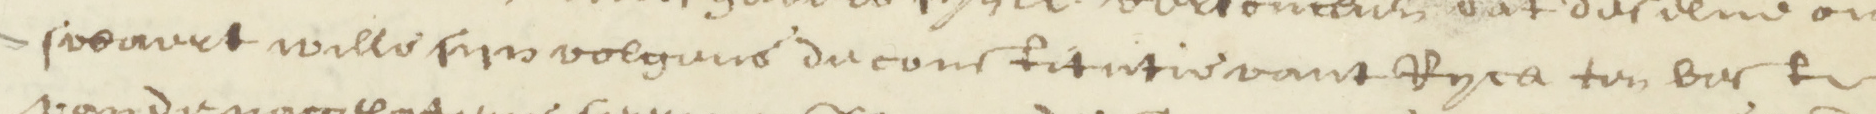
swaert wille syn volgens de constitutie vant Rijck ten beste
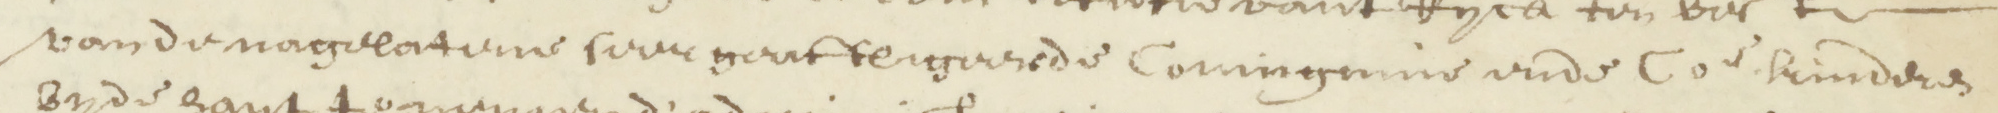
van de nagelatene seer geaffligeerde Coninginne ende Cos. kinderen
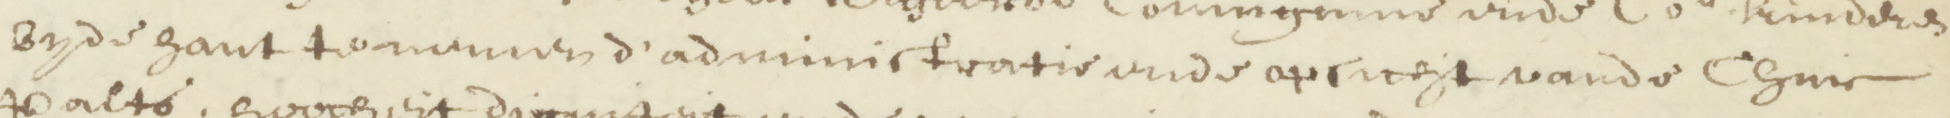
by de hant te nemen d'administratie ende opsicht vande Chur
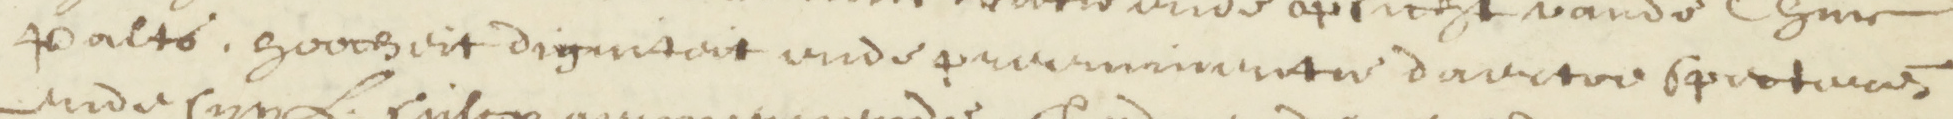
Palts, hoocheit digniteit ende preeminentie daertoe specteren
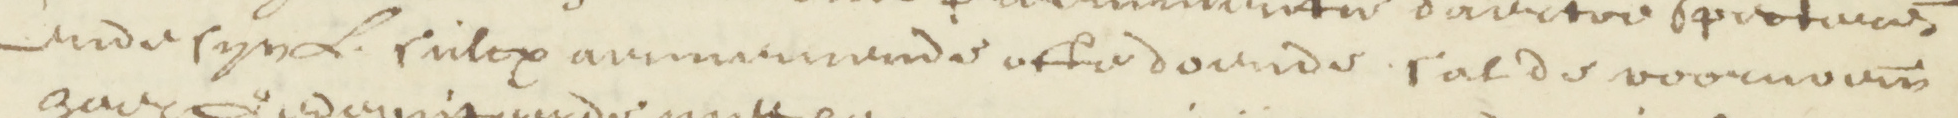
ende syn E. sulcx aennemende ofte doende sal de voornoem
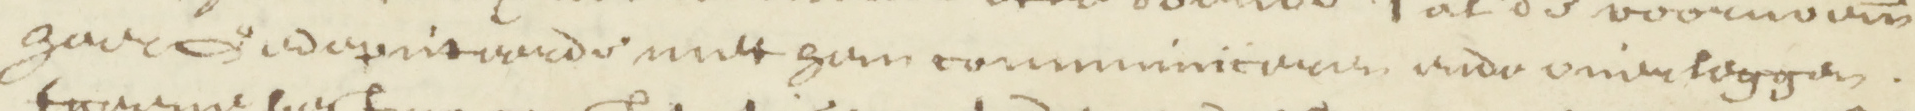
heer Gedeputeerde met hem communiceren ende ouerleggen.
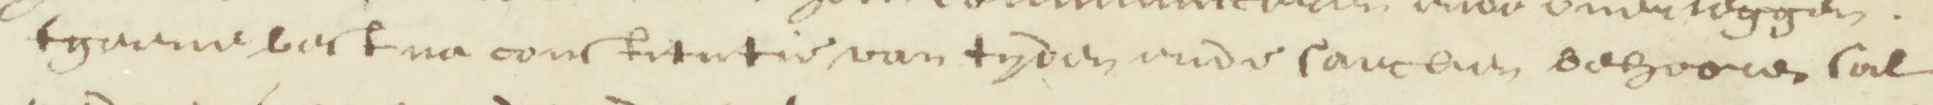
tgeene best na constitutie van tyden ende saecken behooren sal
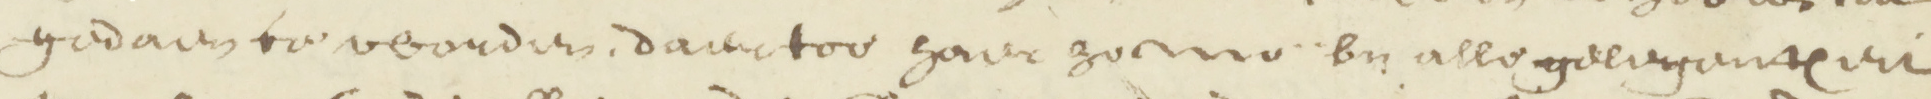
gedaen te worden, daertoe haer hoMo: bij alle gelegentheit
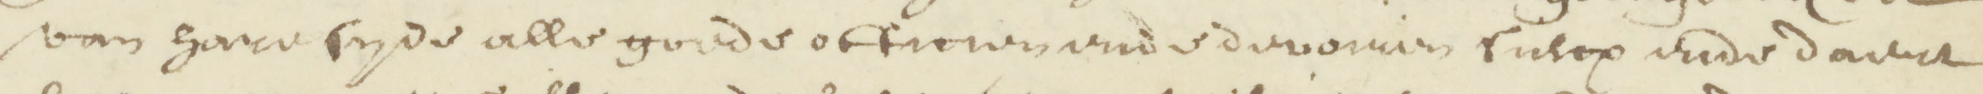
van hare syde alle goede officien ende devoiren sulcx ende daert
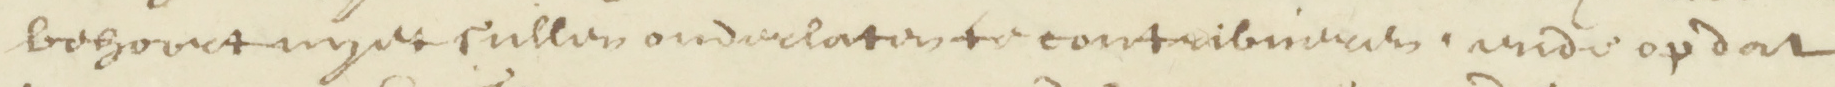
behoort nyet sullen onderlaten te contribueren, ende op dat
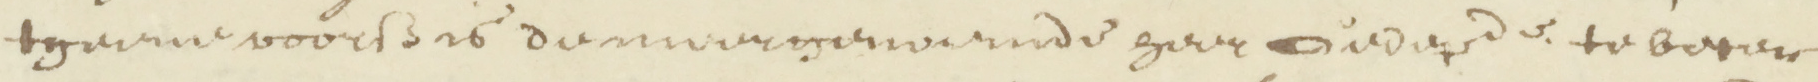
tgeene voors is de meergenoemde heer Gedepde. te beter
